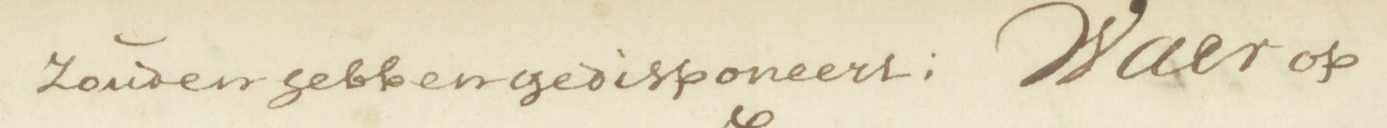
zouden hebben gedisponeert: Waer op
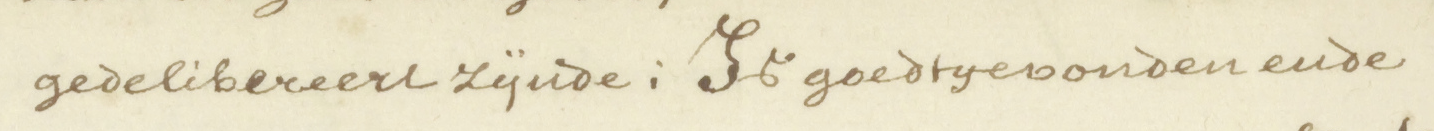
gedelibereert zijnde: Is goedtgevonden ende
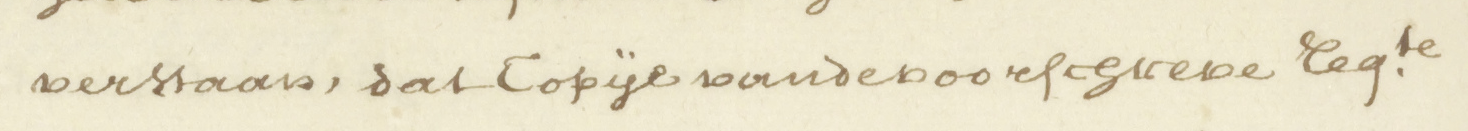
verstaan, dat Copije vande voorschreve reqte
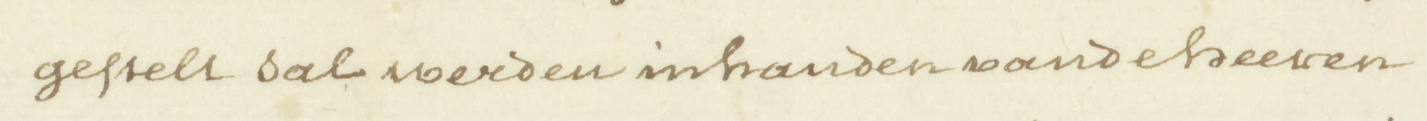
gestelt sal werden in handen vande heeren
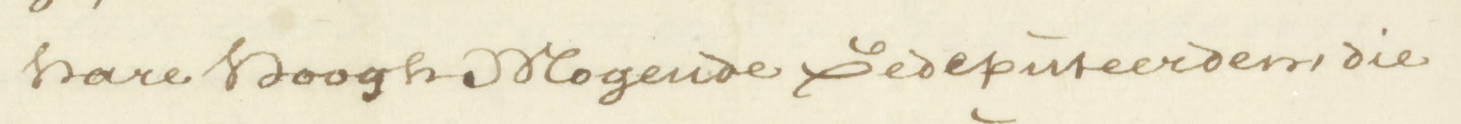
hare Hoogh Mogende Gedeputeerden, die
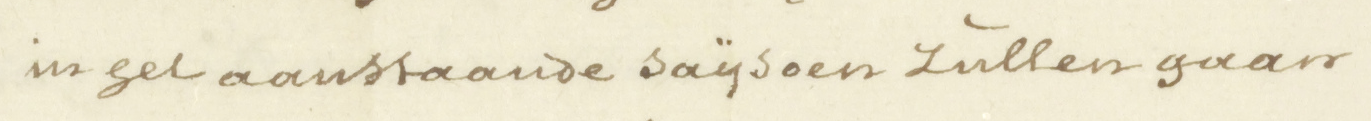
in het aanstaande saijsoen zullen gaan
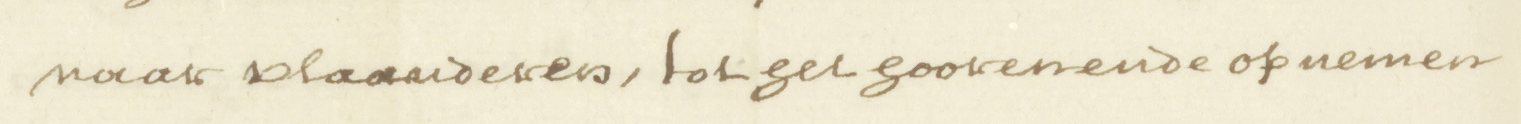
naar Vlaanderen, tot het hooren ende opnemen
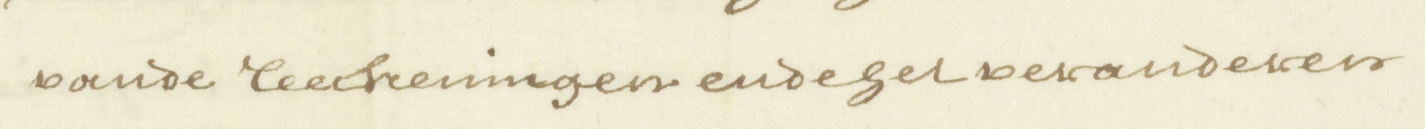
vande reeckeningen ende het veranderen
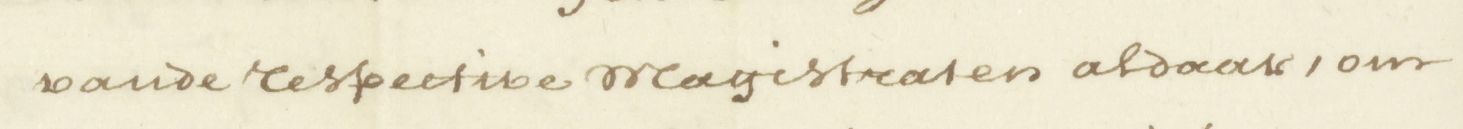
vande respective magistraten aldaar, om
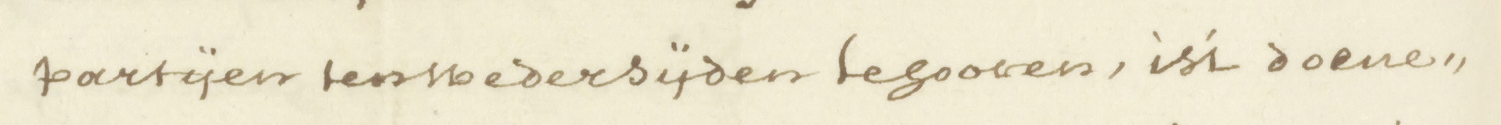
partijen ten wedersijden te hooren, is't doene„
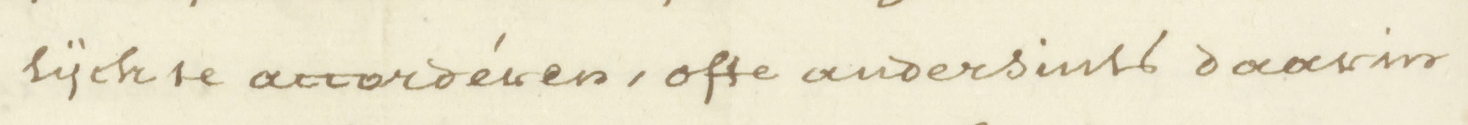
lijck te accorderen, ofte andersints daarin
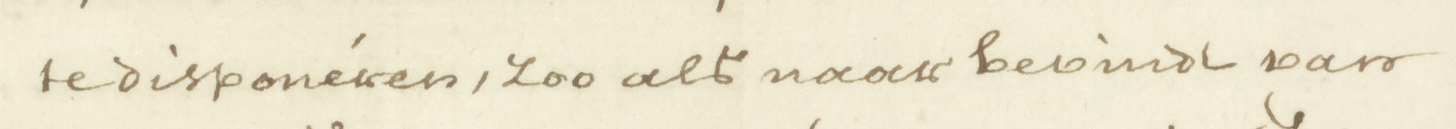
te disponeren, zoo als naar bevindt van
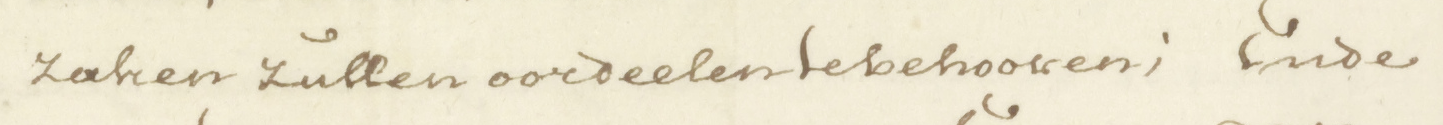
zaken zullen oordeelen te behooren: Ende
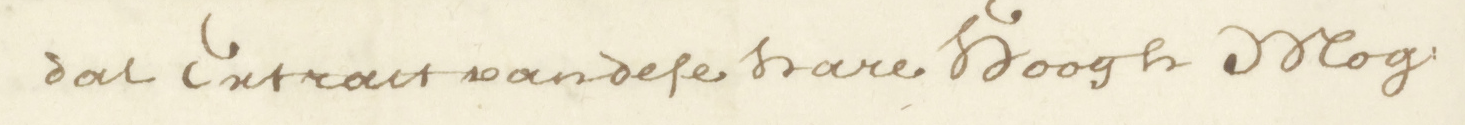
dat Extract van dese hare Hoogh Mog:
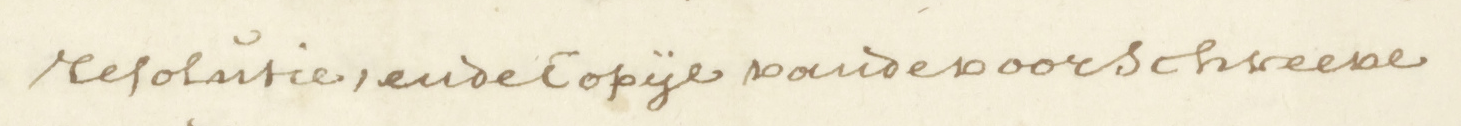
resolutie, ende copije vande voorschreeve
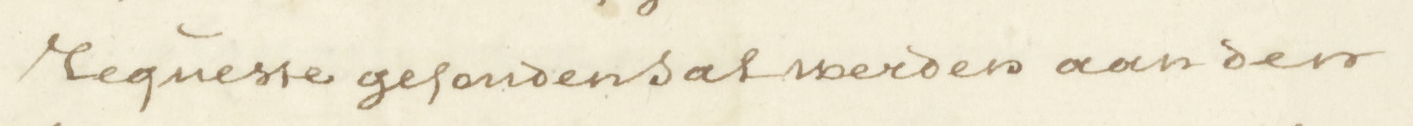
requeste gesonden sal werden aan den
